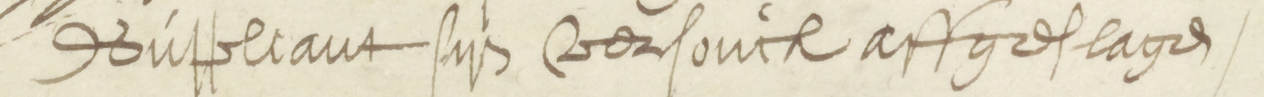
Suppliant sijn versouck affgeslagen.
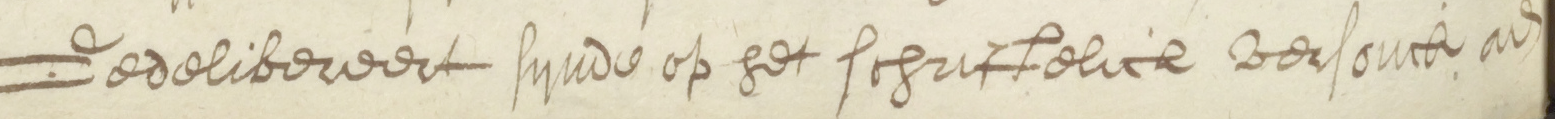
Gedelibereert sijnde op het schriftelick versouck aen
